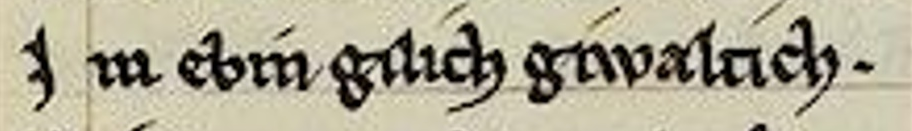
Im ebin gilich giwaltich.
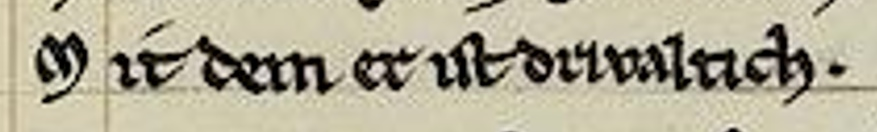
Mit dem er iſt drivaltich.
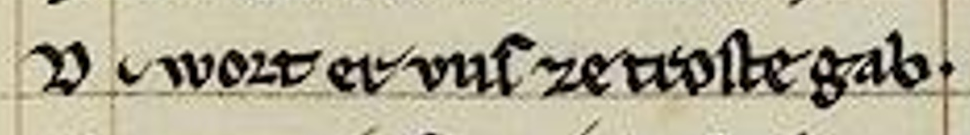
D(az) wort er vnſ ze troſte gab.
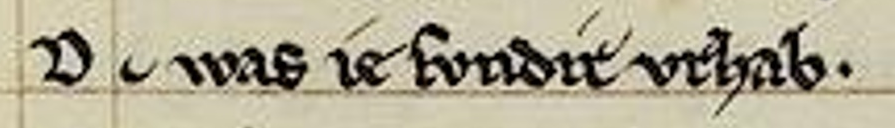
D(az) was ie ſvndir vrhab.
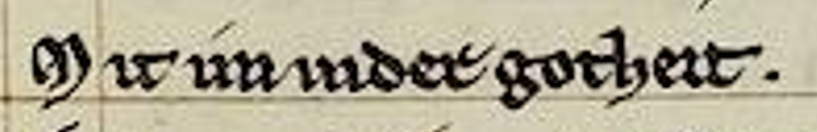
Mit im inder gotheit.
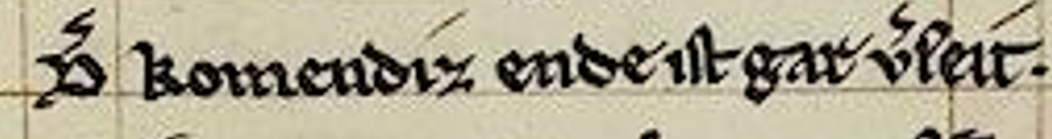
D(er) komendiz ende iſt gar v(er)ſeit.
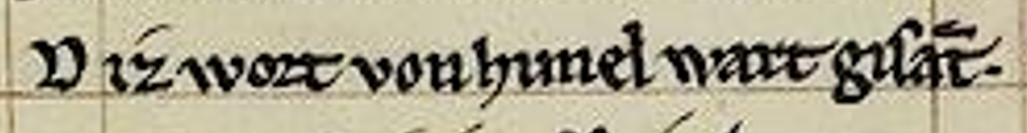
Diz wort von himel wart giſa(n)t.
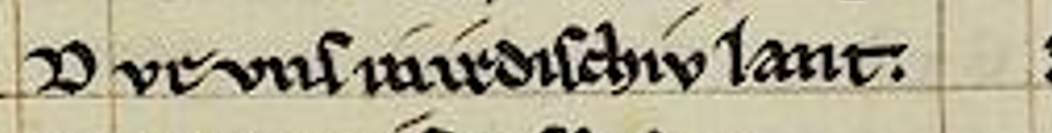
Dvr vnſ in irdiſchiv lant.
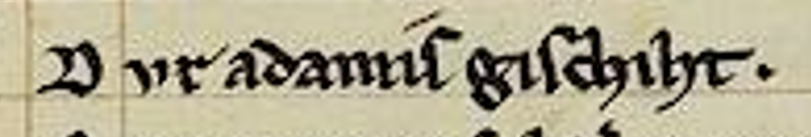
Dvr adamiſ giſchiht.
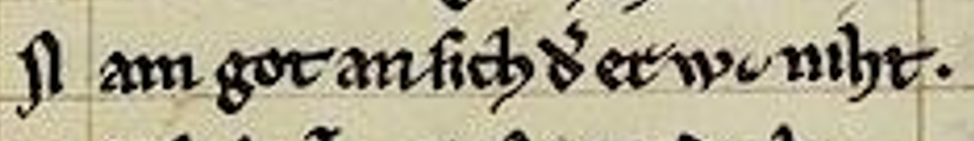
Nam got an ſich d(er) er w(az) niht.
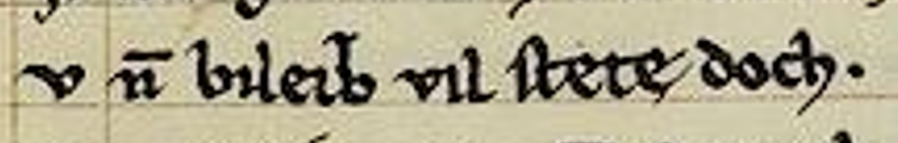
Vn(d) bileib vil ſtete doch.
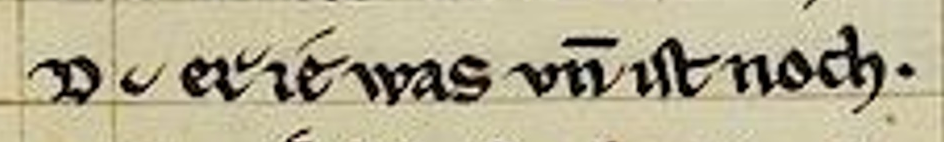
D(az) er ie was vn(d) iſt noch.
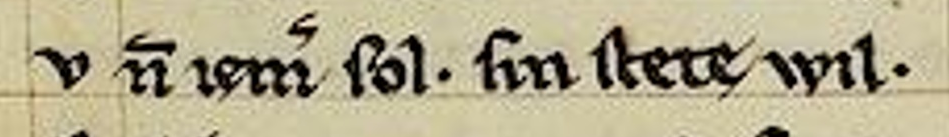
Vn(d) iem(er) ſol. ſin ſtete wil.
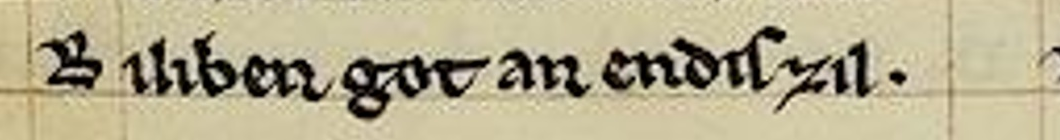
Biliben got an endiſ zil.
